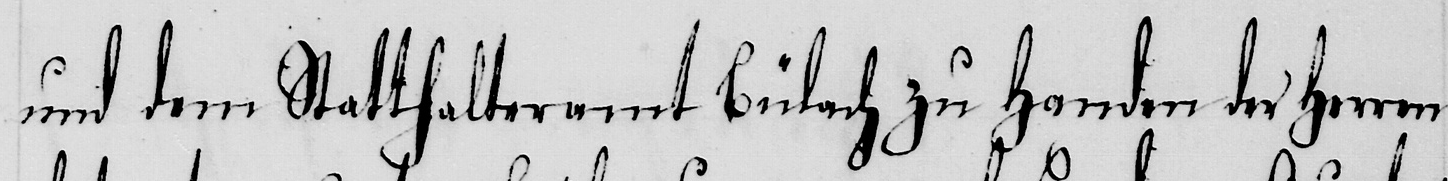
und dem Statthalteramt Bülach zu Handen der Herr¬
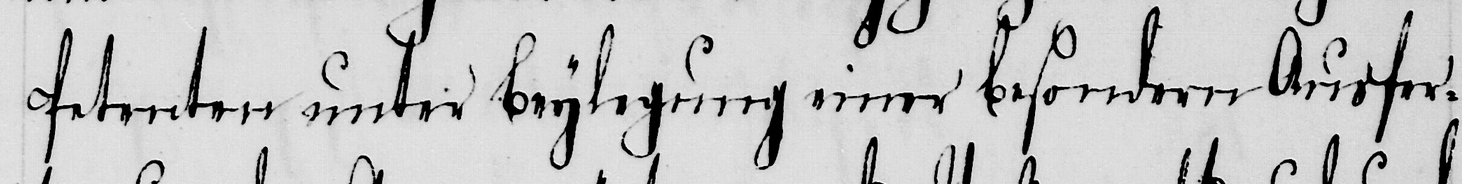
Petenten unter Beylegung einer besondern Ausfer¬
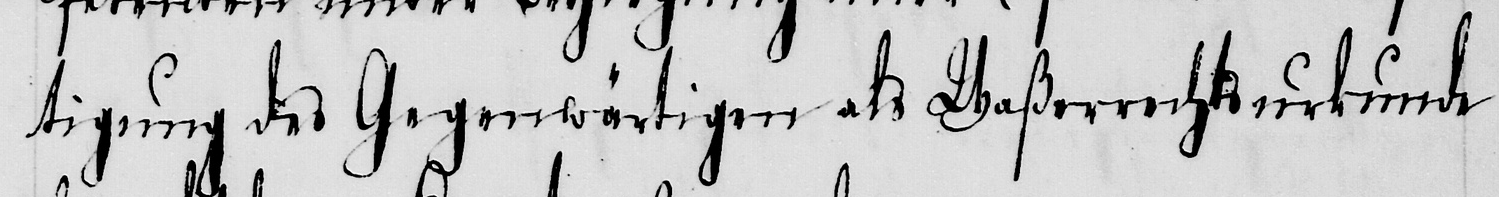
tigung des Gegenwärtigen als Waßerrechtsurkunde
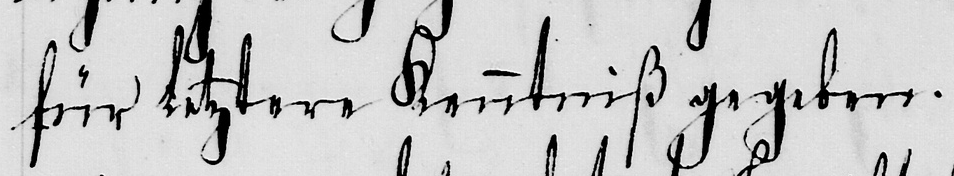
für Letztere Kenntniß gegeben.
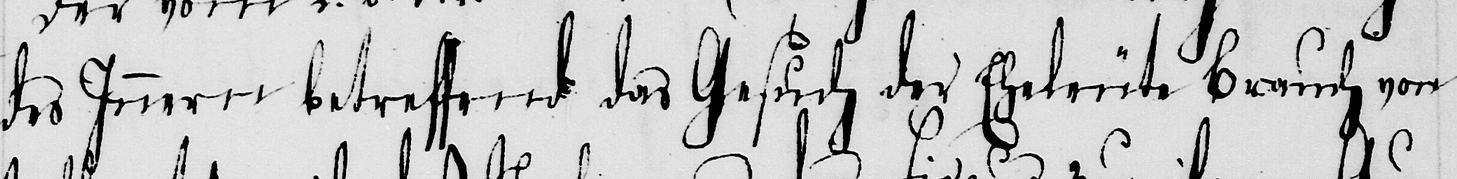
des Innern betreffend das Gesuch der Eheleute Brauch von
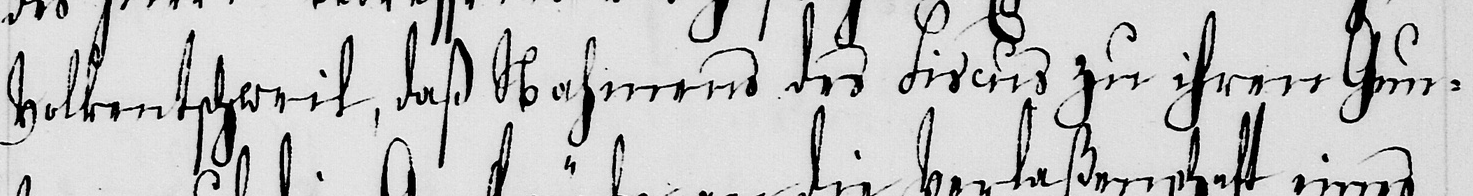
Volkentschweil, daß Nahmens des Fiscus zu ihren Gun¬
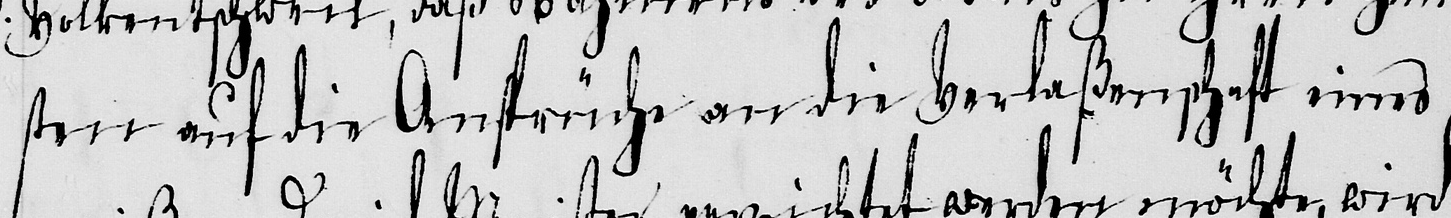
sten auf die Ansprüche an die Verlaßenschaft eines
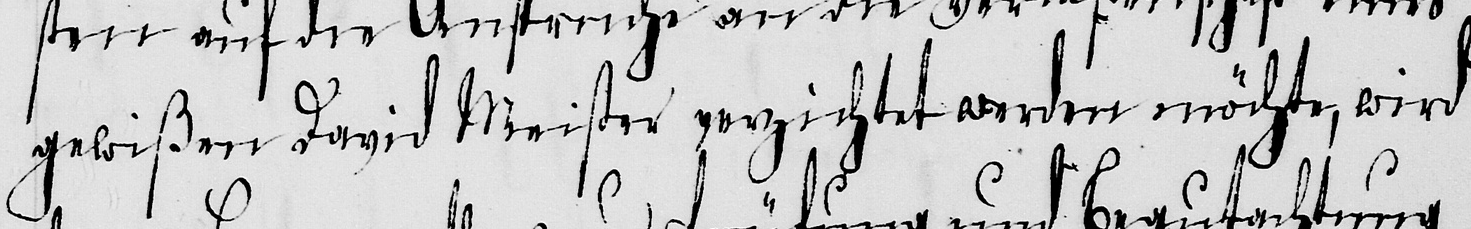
gewißen David Meister verzichtet werden möchte, wird
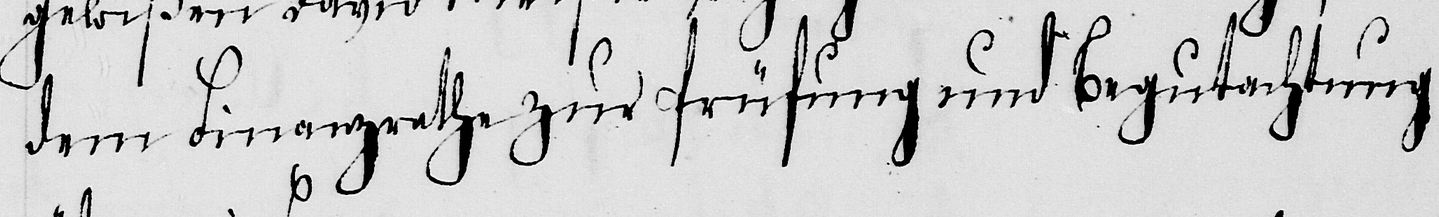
dem Finanzrathe zur Prüfung und Begutachtung
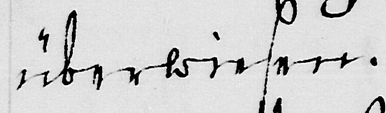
überwiesen.
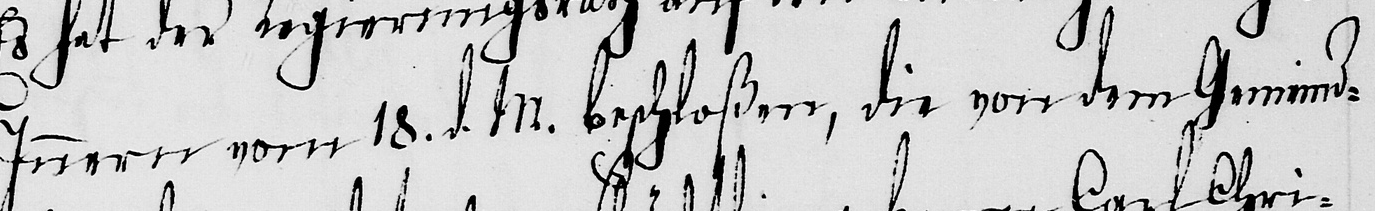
Innern vom 18. d. M. beschloßen, die von dem Gemeind¬
